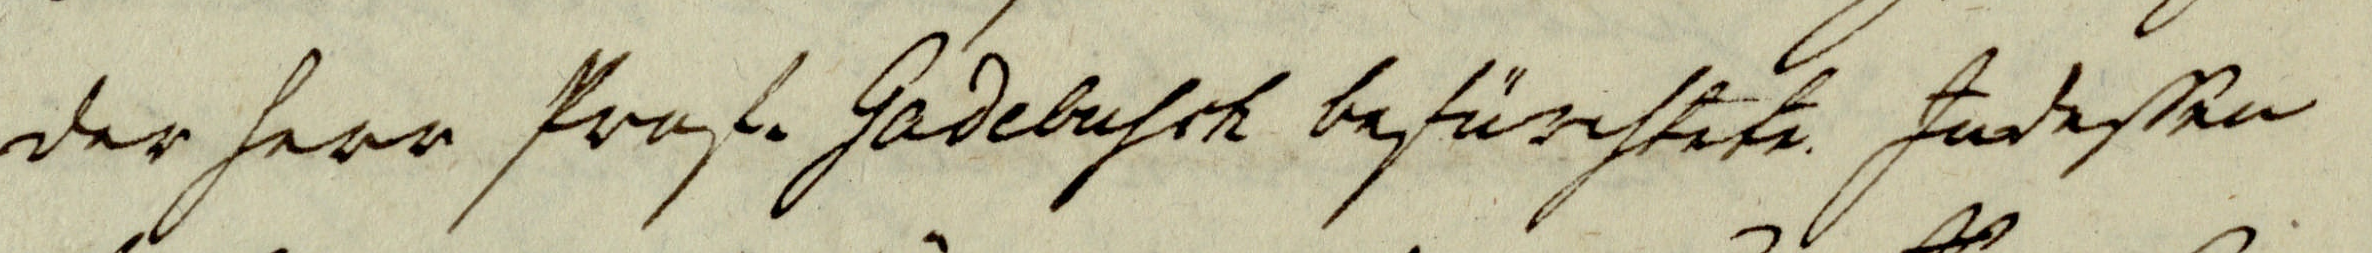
der Herr Prof. Gadebusch befürchtete. Indessen
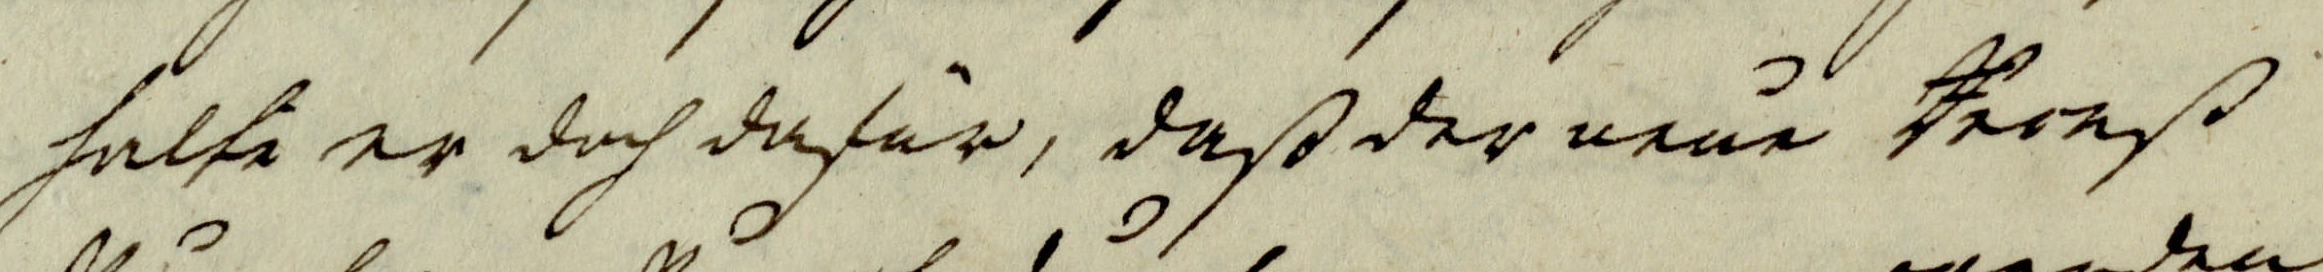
halte er doch dafür, daß der neue Receß
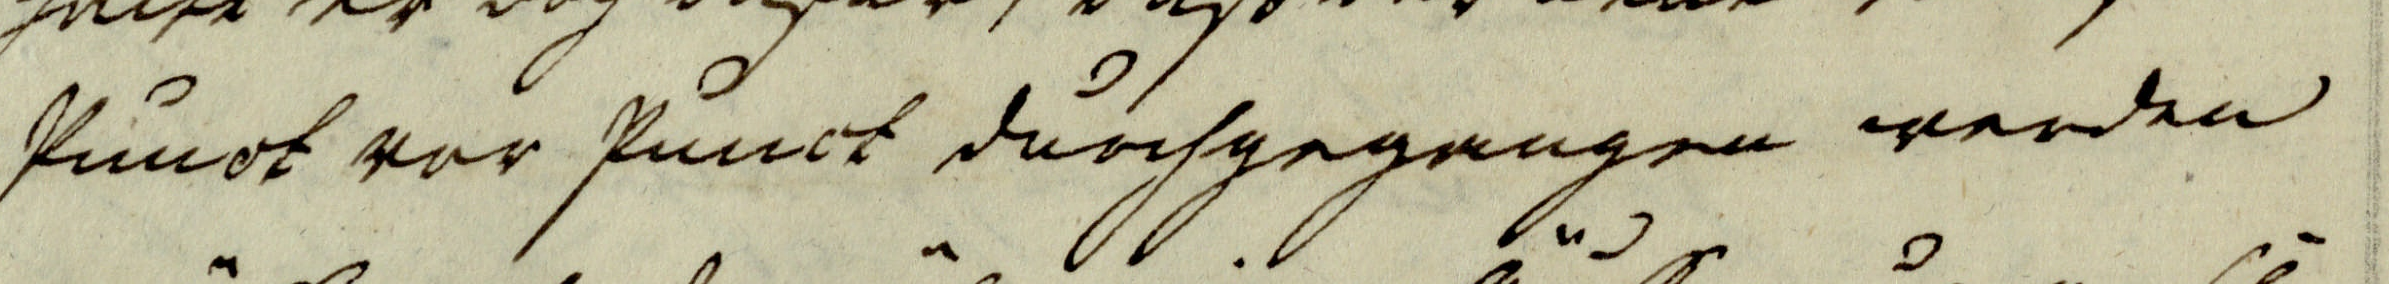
Punct vor Punct darchgegungen werden
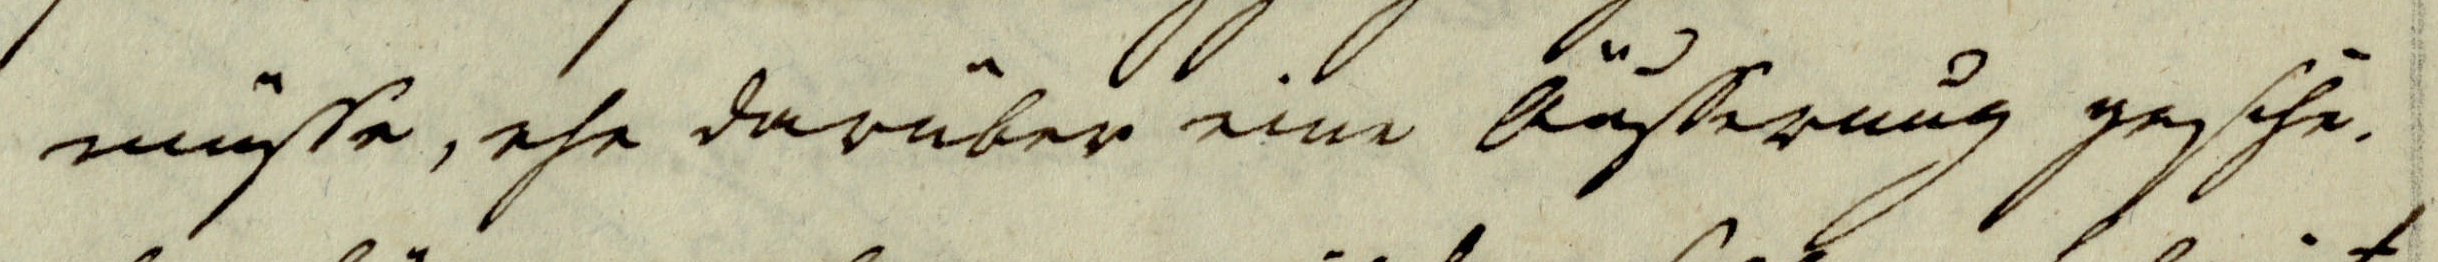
müsse, ehe darüber eine Äusserung gesche¬
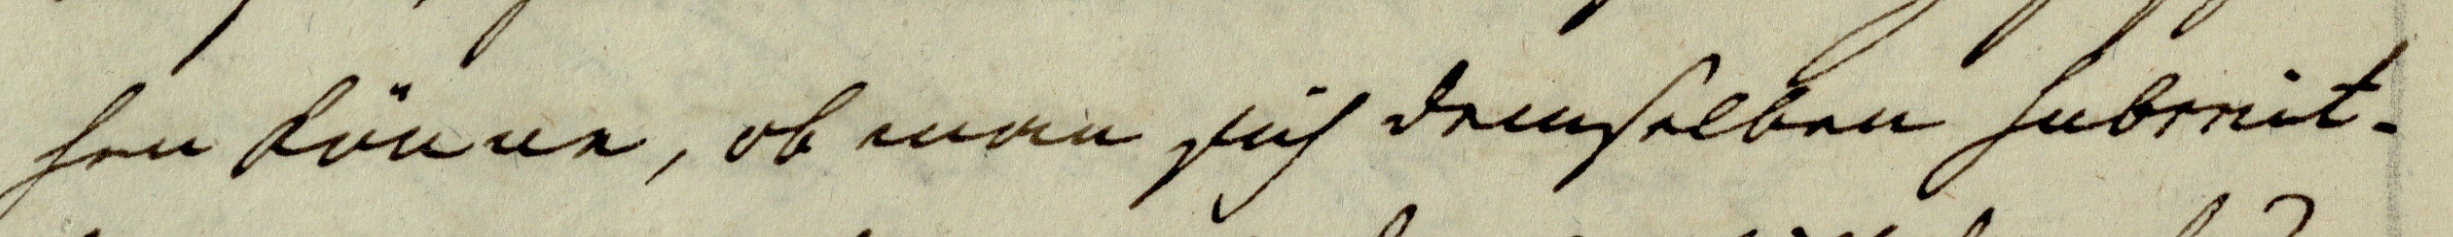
hen könne, ob man sich demselben submit¬
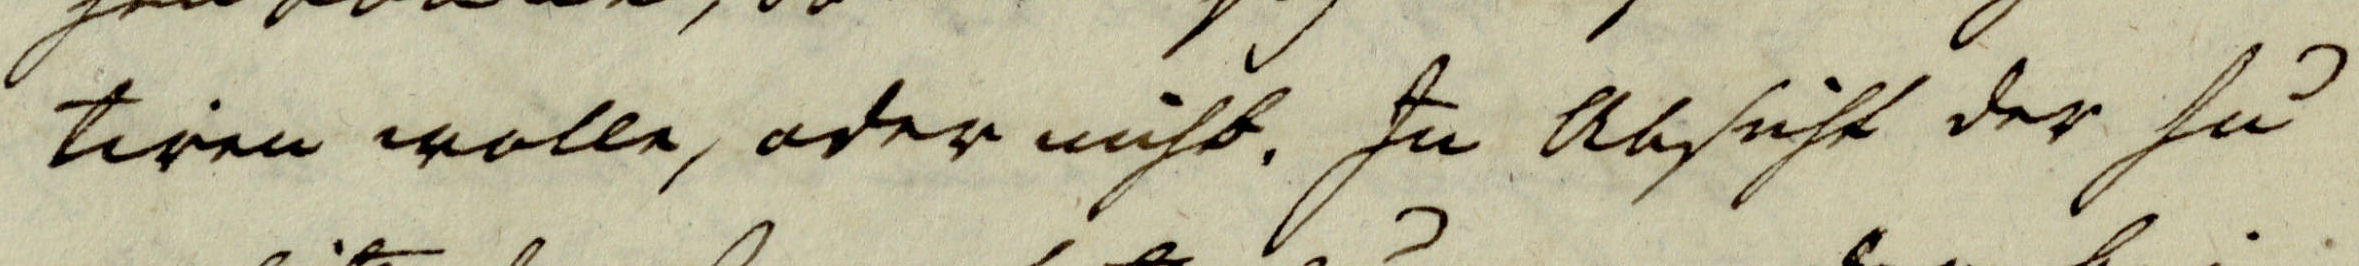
tiren wolle, oder nicht. In Absicht der zu
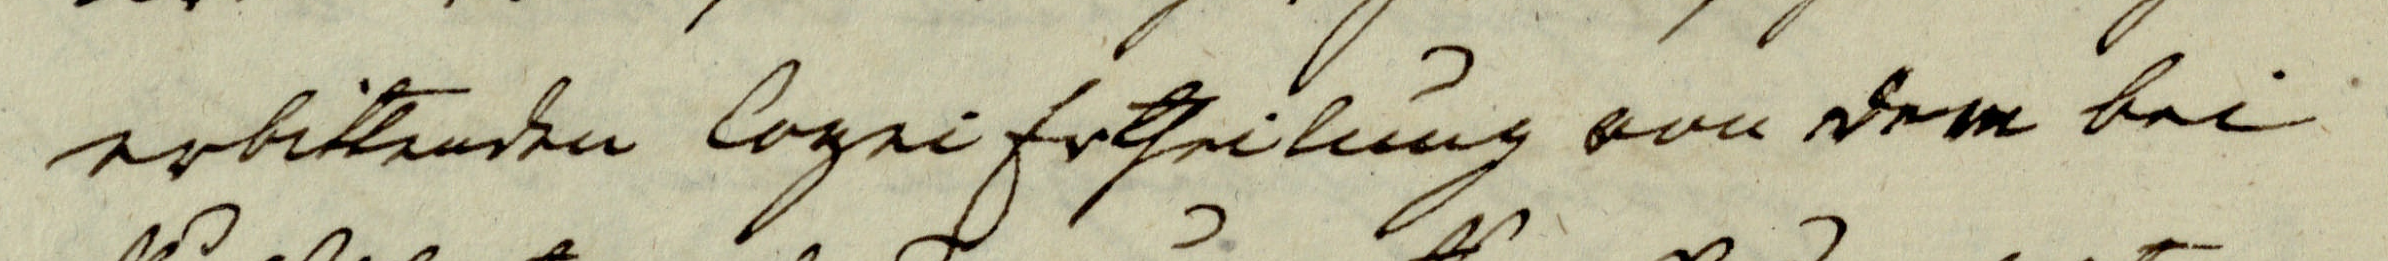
erbittenden Copei Ertheilung von dem bei
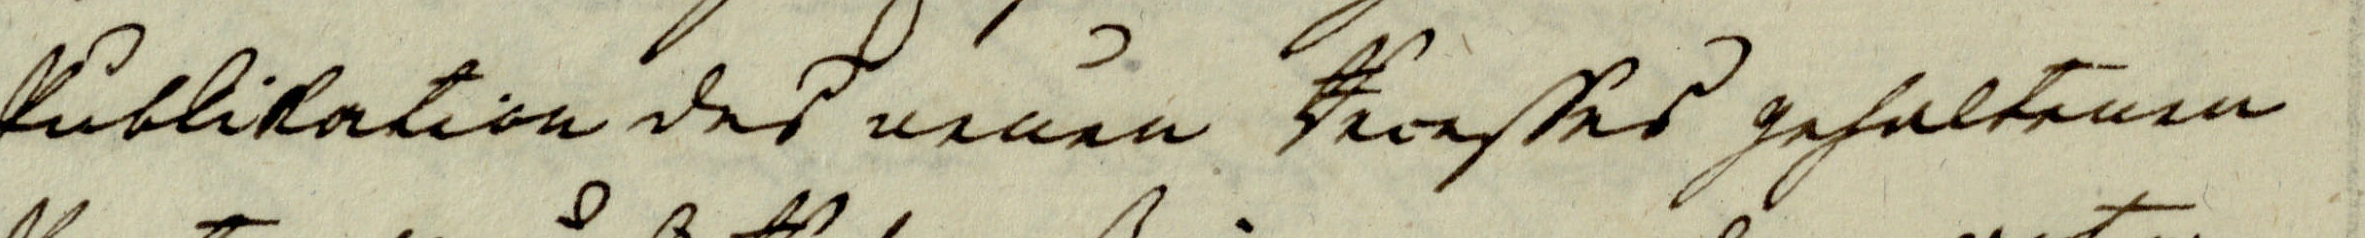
Publikation der neuen Recesses gehaltenen
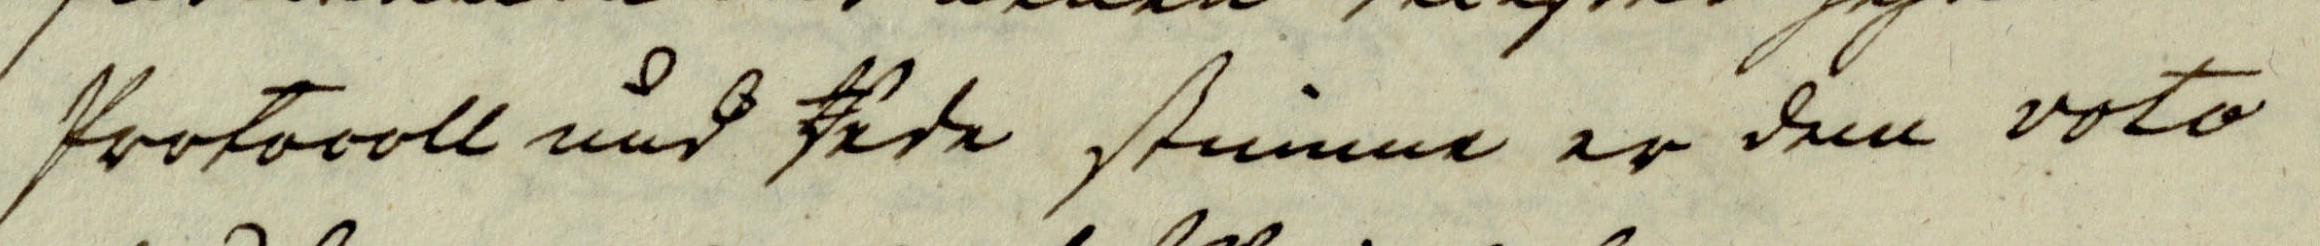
Protocoll und Rede stimme er dem voto
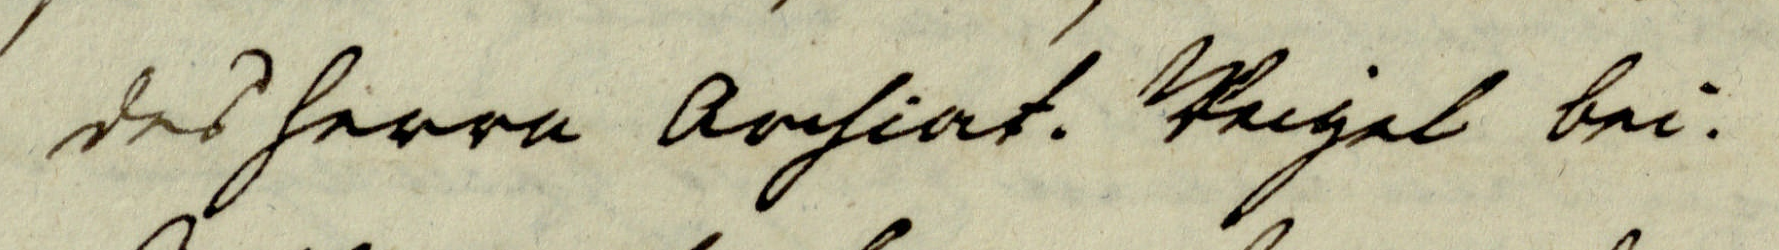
des Herrn Archiat. Weigel bei.
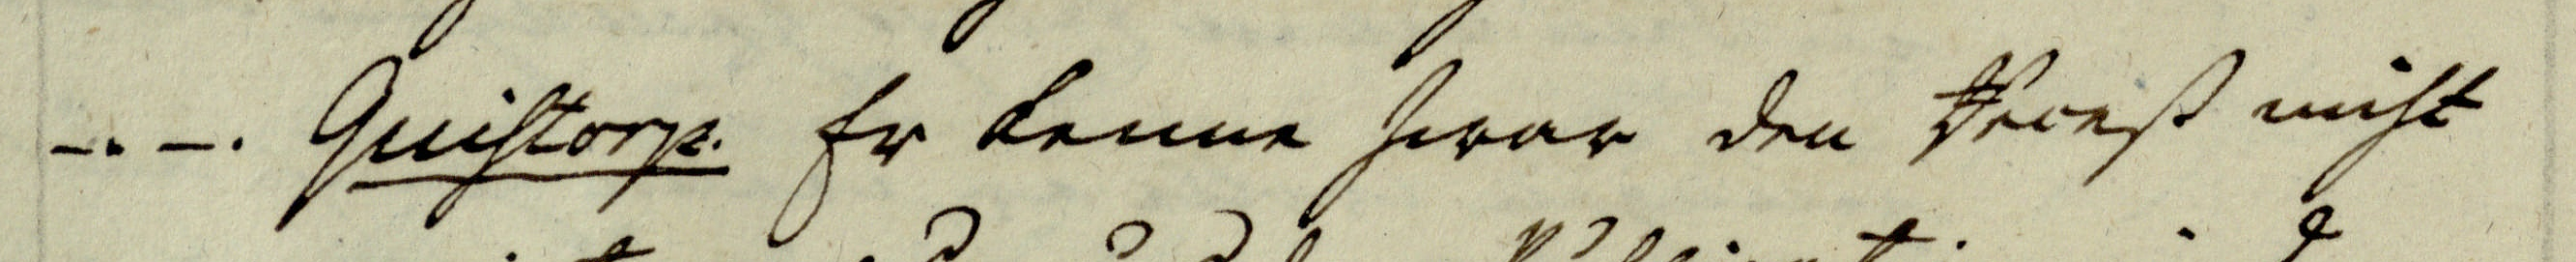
Quistorp. Er kenne zwar den Receß nicht
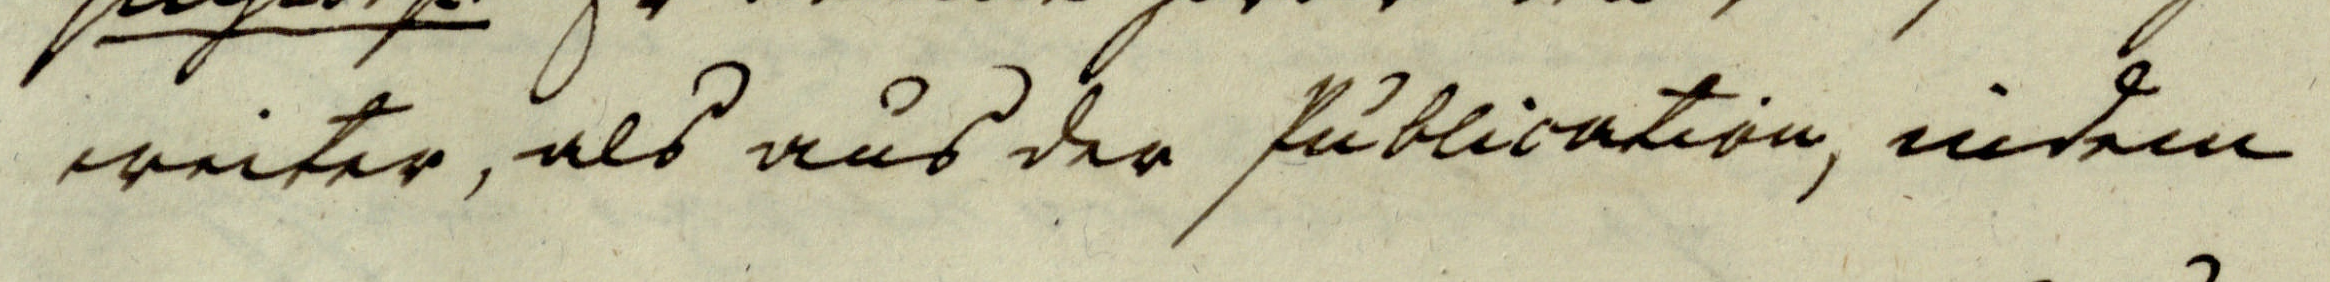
weiter, als aus der Publication, indem
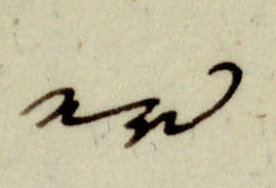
er
